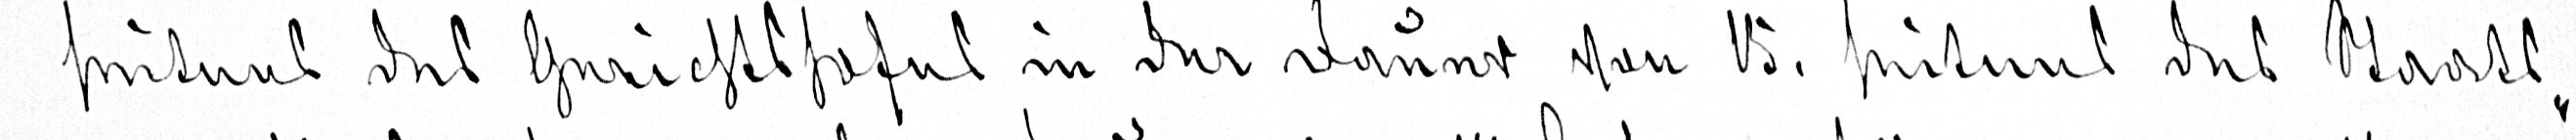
seitens des Gerichtshofes in der Dauer von 15. seitens des Staats¬
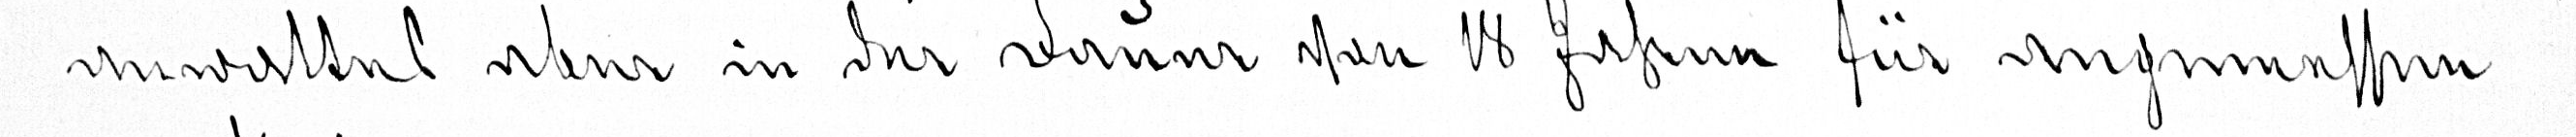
anwaltes aber in der Dauer von 18 Jahren für angemessen
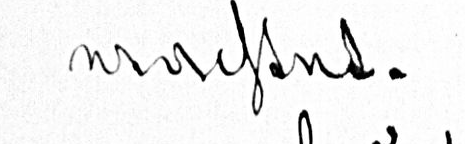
wachtet.
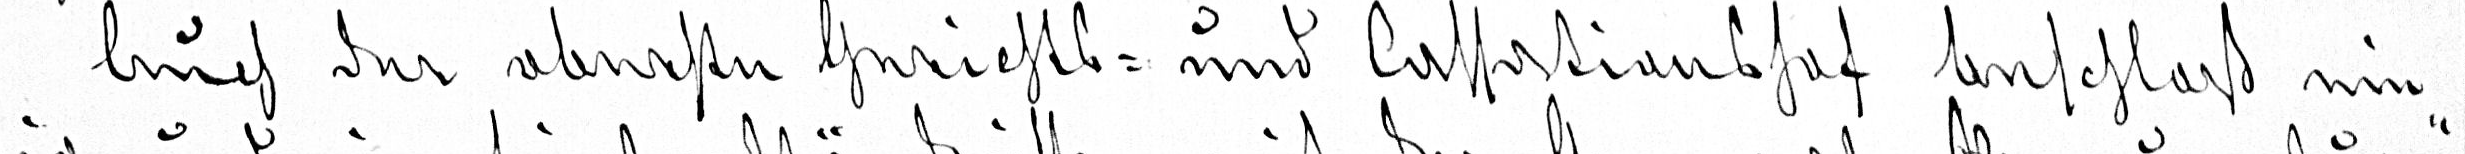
Auch der oberste Gerichts- und Cassationshof Anschlaß ein¬
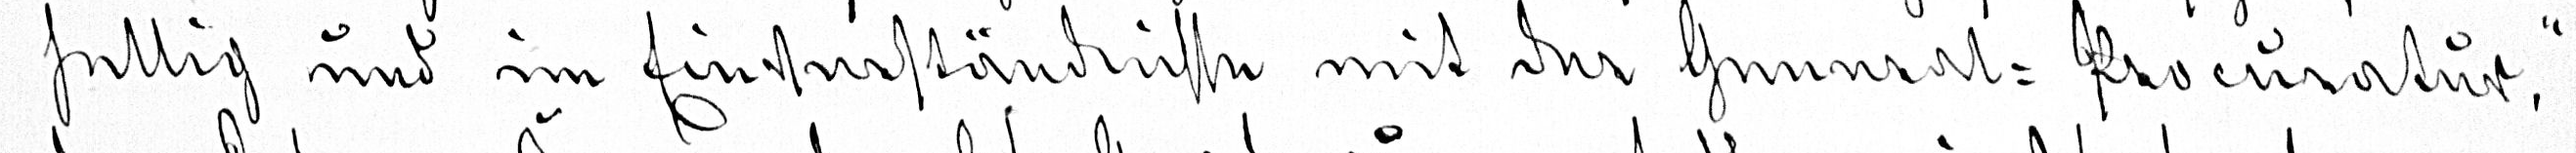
sellig und im Einverständnisse mit der General - Procuratur,
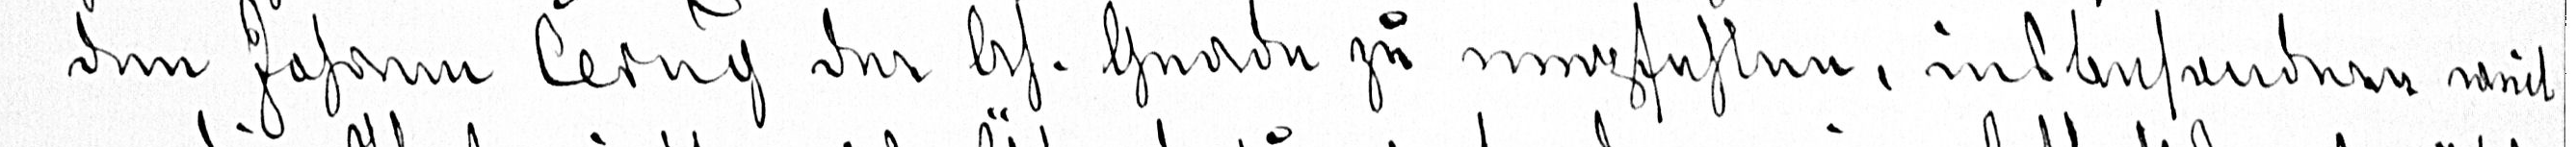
den Johann Černy der Ah. Gnade zu empfehlen, insbesondere weil
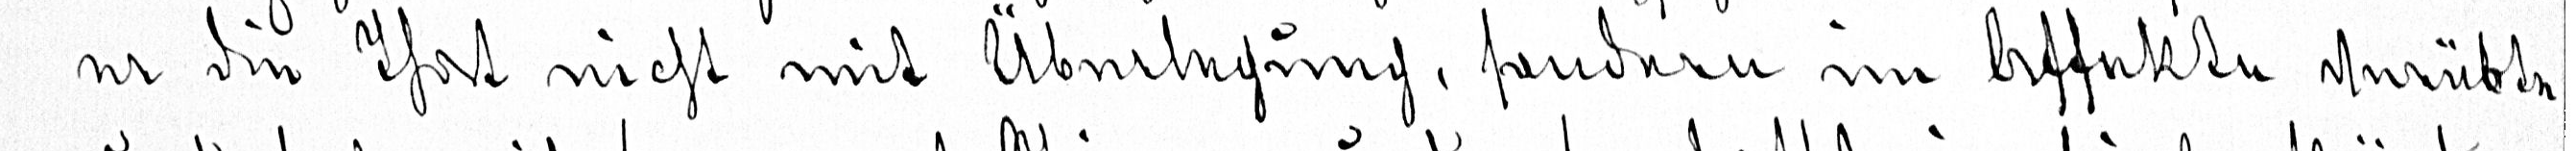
er die That nicht mit Überlegung, sondern im Affekte verübte
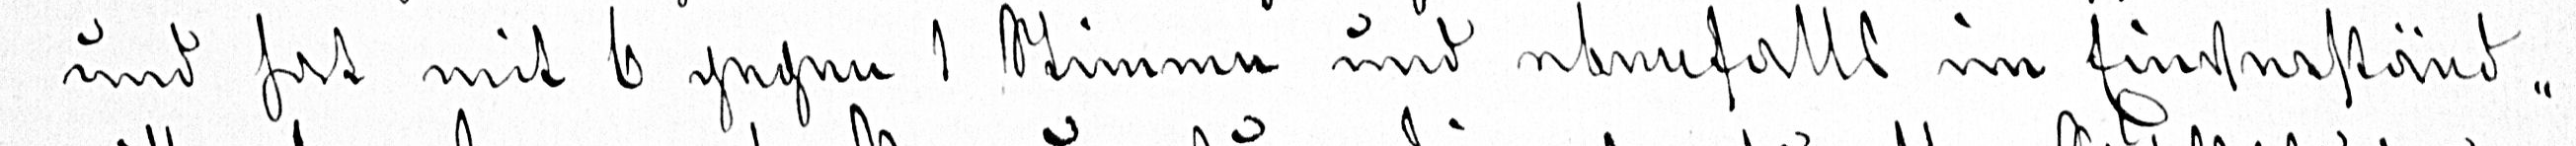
und hat mit 6 gegen 1 Stimme und ebenfalls in Einverständ¬
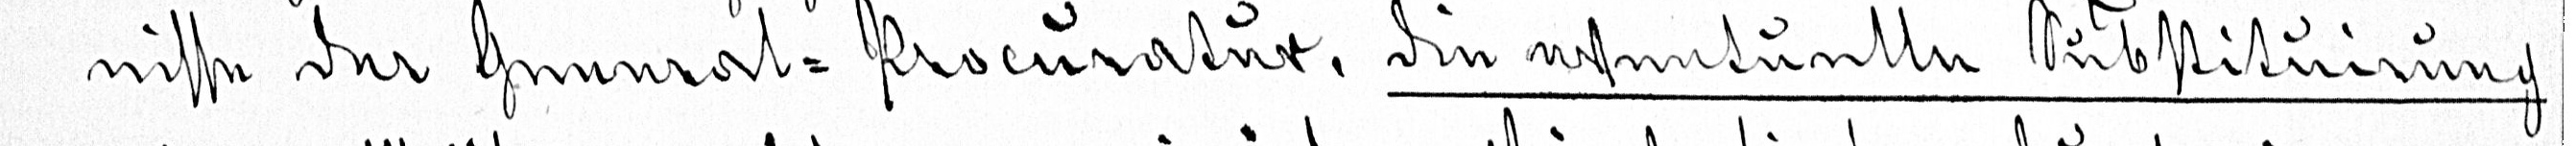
nisse der General - Procuratur, die eventuelle Substituierung
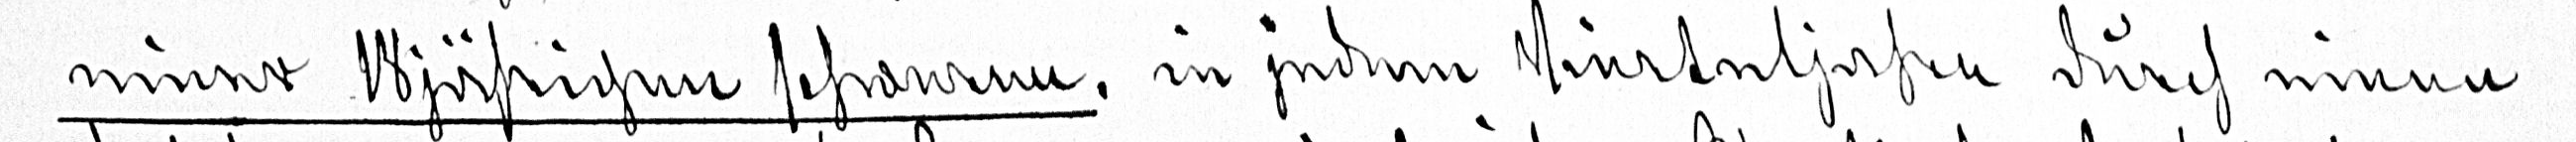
einer 18jährigen schweren, in jedem Vierteljahen durch einen
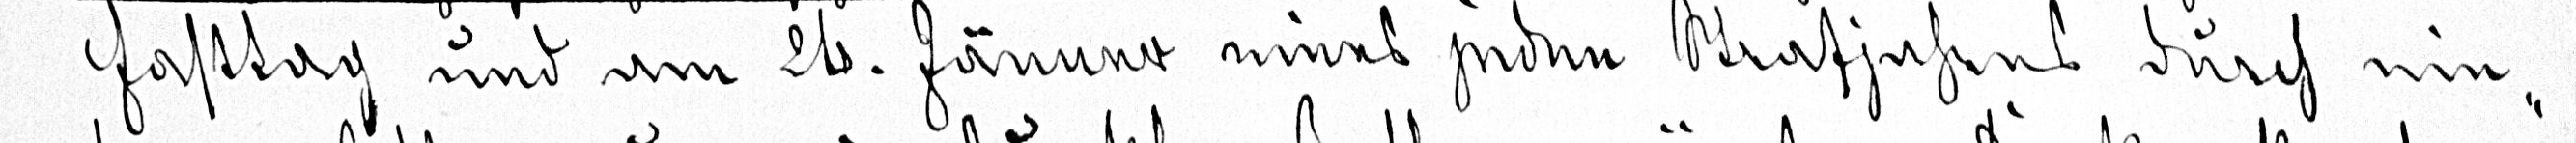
Fasttag und am 26. Jänner eines jeden Strafjahres durch ein¬
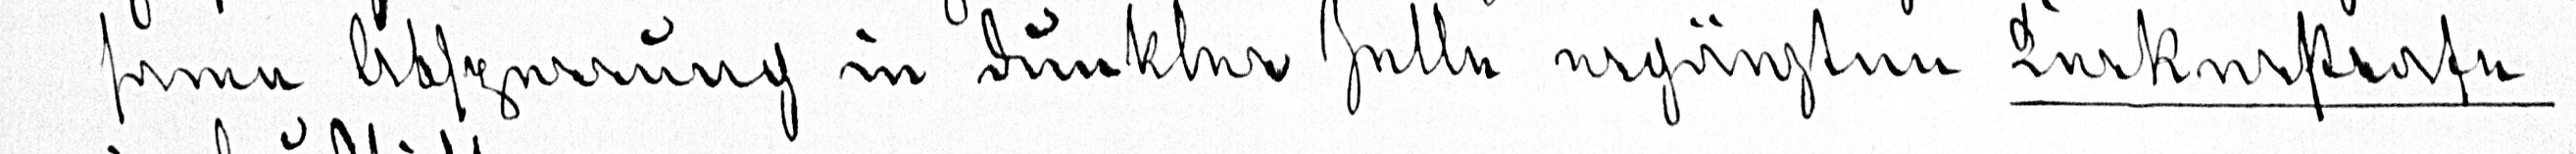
same Absperrung in Dunkler Zelle ergänzten Kerkerstrafe
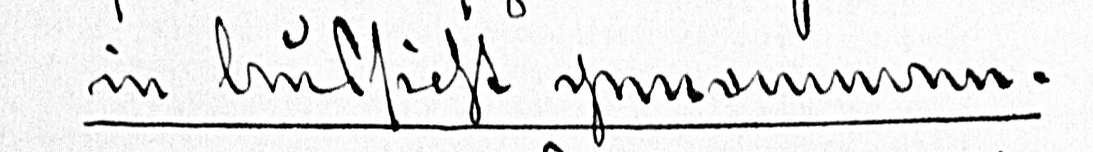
in Aussicht genommen.
